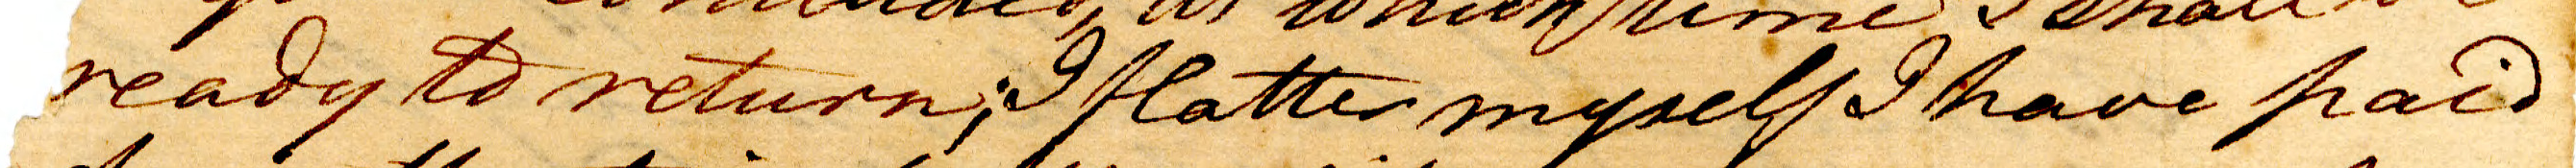ready to return; I flatter myself I have paid
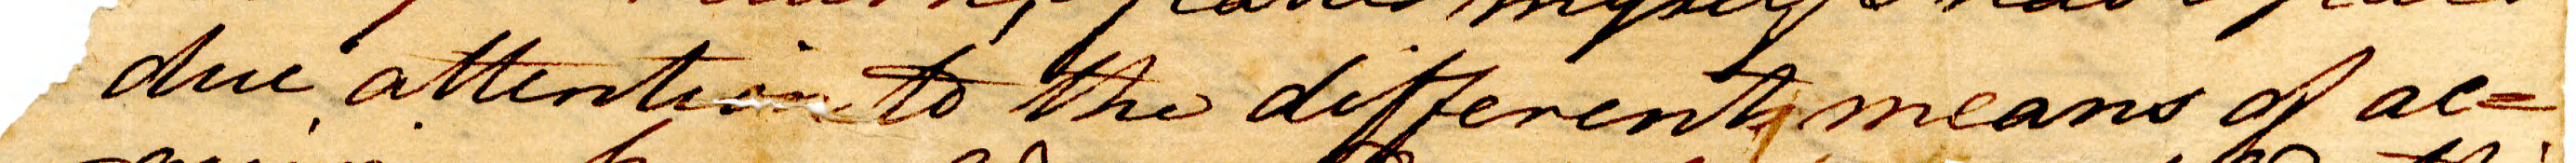due attention to the different means of ac-
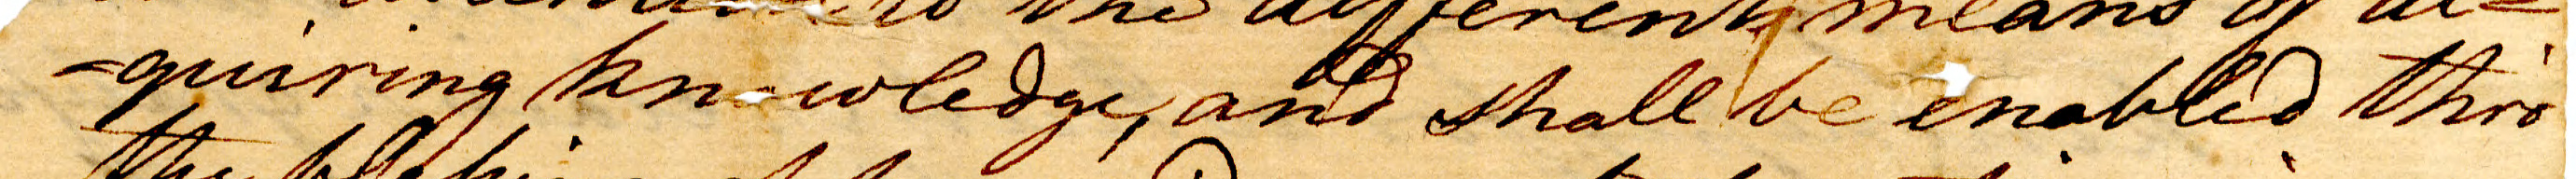-quiring knowledge, and shall be enabled thro
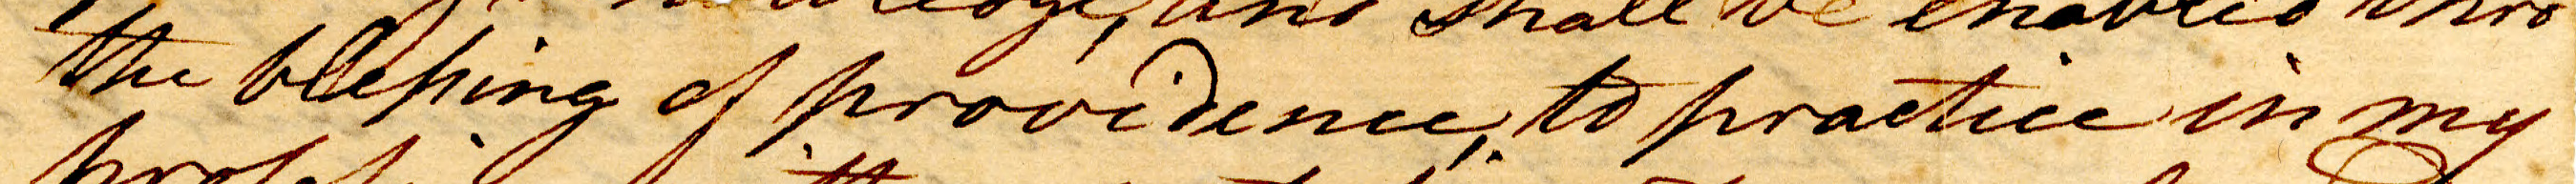the blessing of providence, to practice in my
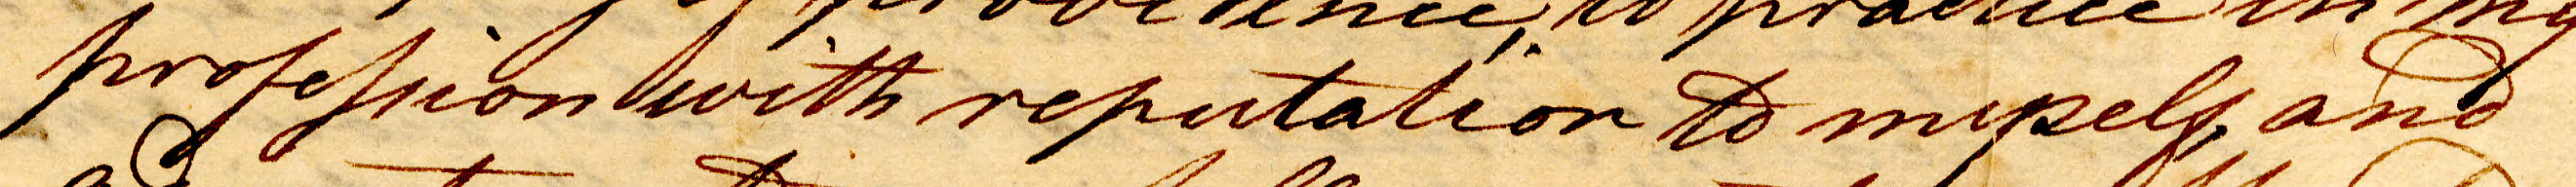profession with reputation to myself, and
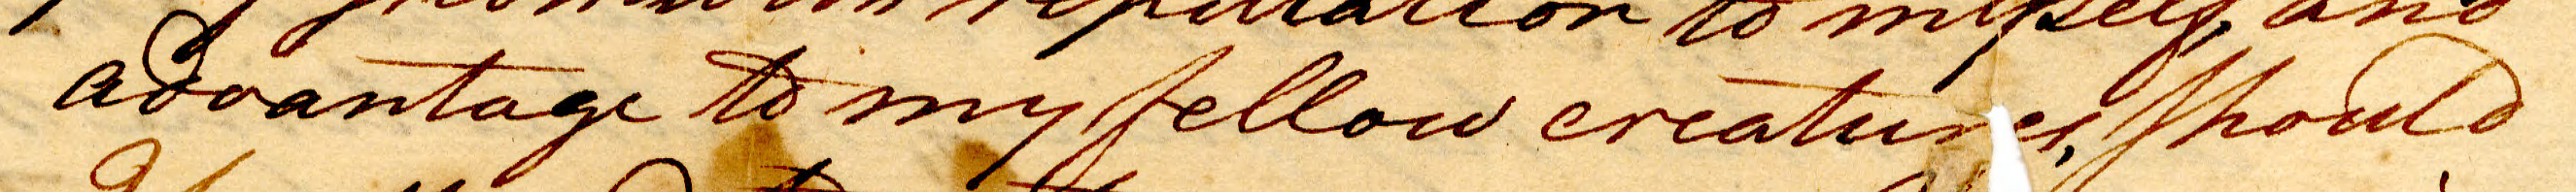advantage to my fellow creatures, should
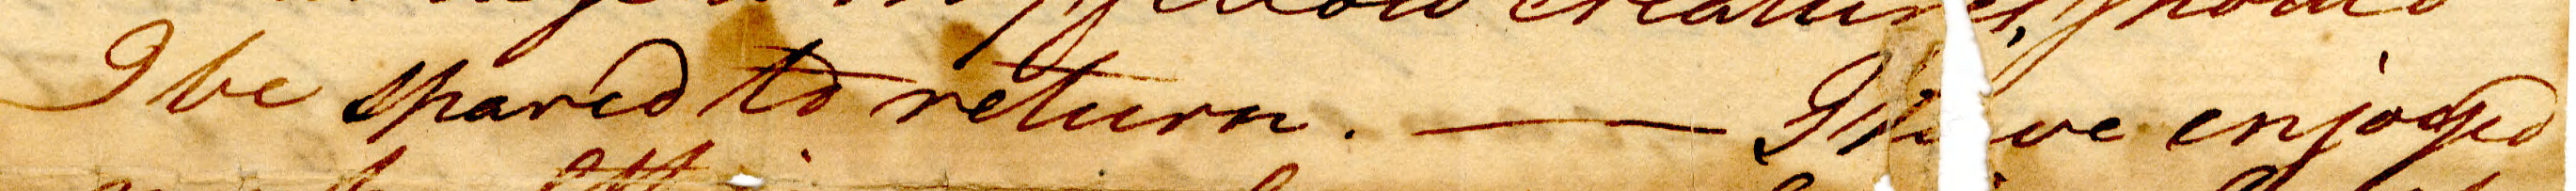I be spared to return.- I h[_]ve enjoyed
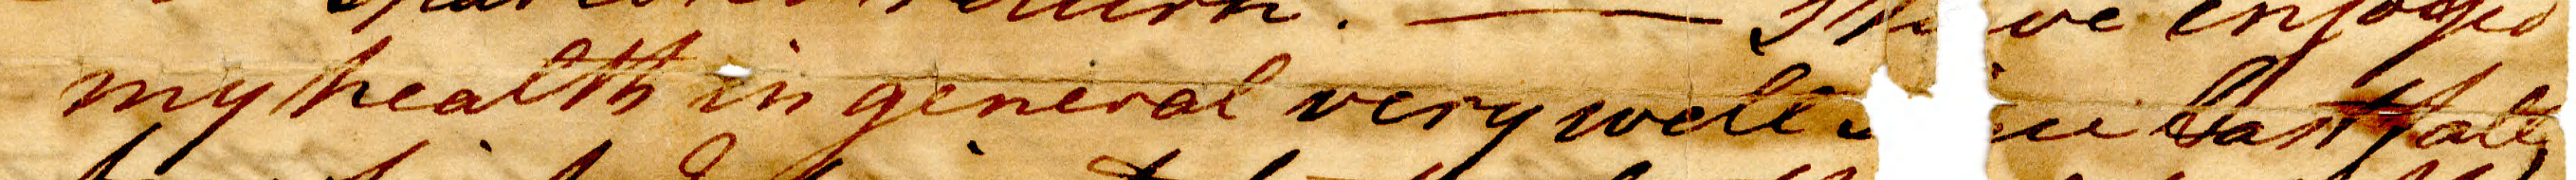my health in general very well [___]ce last fall,
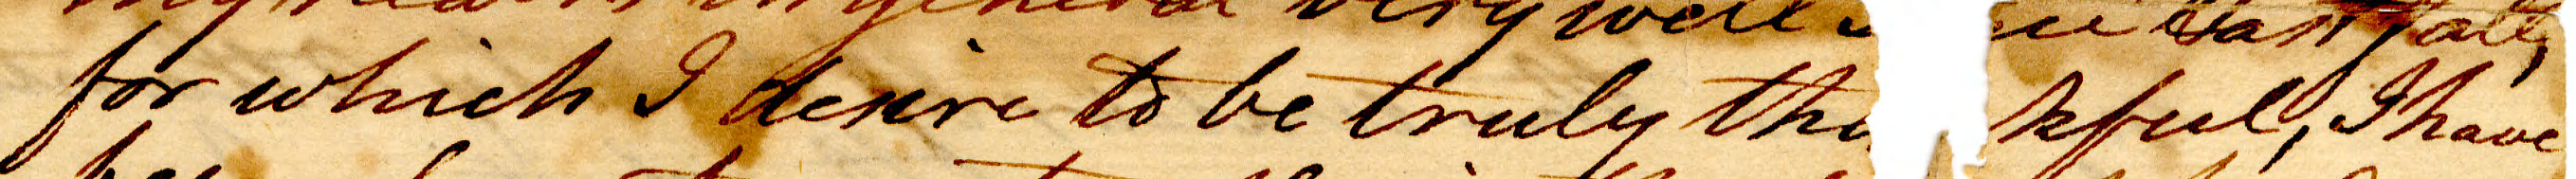for which I desire to be truly th[__]kful, I have
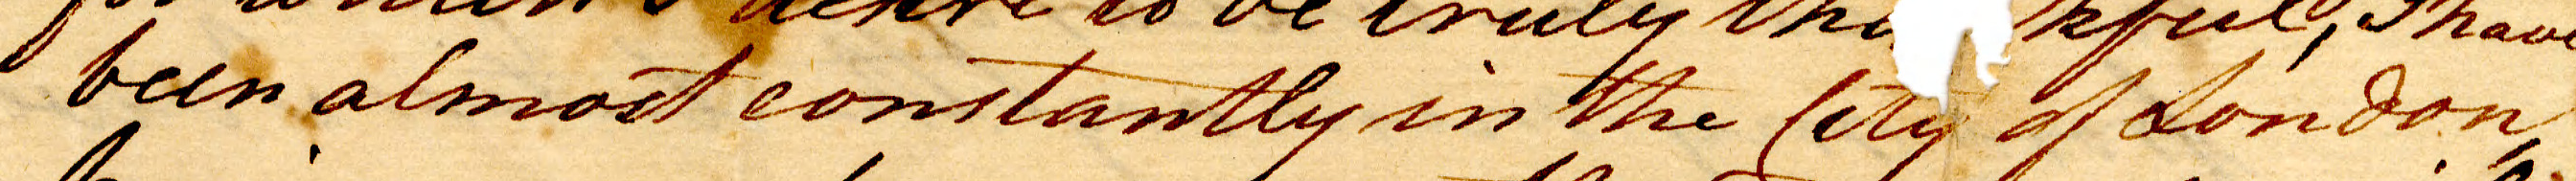been almost constantly in the City of London,
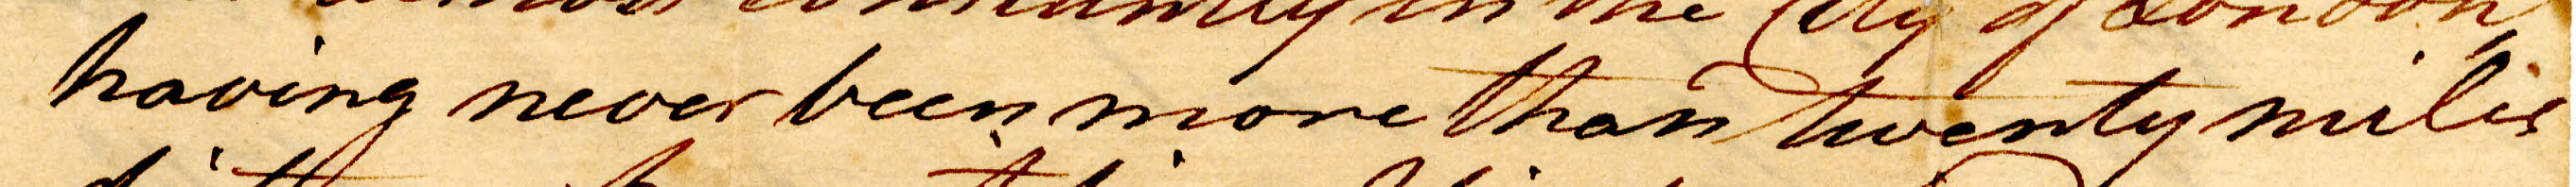having never been more than twenty miles
